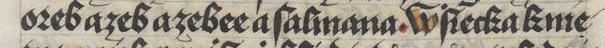oreb a zeb a zebee a ſalmana.Wẛiecka knie¬
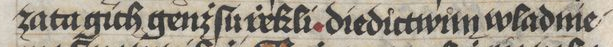zata gich genż ſu ṙekli.diedictwim wladnie¬
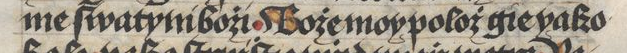me ſwatyni bożí.Boże moy poloż gie yako
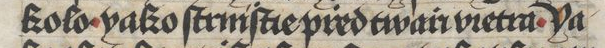kolo.yako ſtrniẛtie pṙed twaṙi vietra.Ya¬
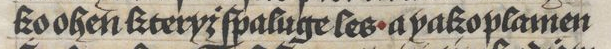ko ohen kteryż ſpaluge les.a yako plamen
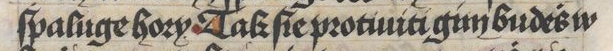ſpaluge hory.Tak ſie protiuiti gim budeṡ w
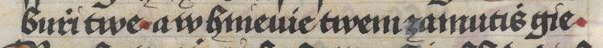buṙi twe.a w hnieuie twem zamutiṡ gie.
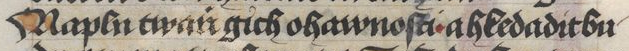Napln twaři gich ohawnoſti.a hledadit bu¬
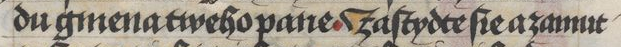bu gmena tweho pane.Zaſtydte ſie a zamut¬
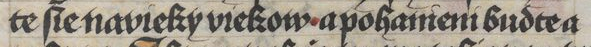te ſie navieky viekow.a pohanieni budte a¬
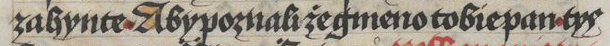zahynte.Aby poznali že gmeno tobie pan.tys
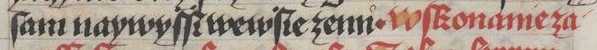ſam naywyẛẛi wewẛie zemi.Wſkonanie za¬
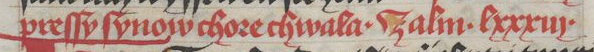preſſy ſunow chore chwala.Zalm.lxxxiii.
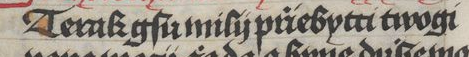Terak gſu milij pṙíebytci twogi
